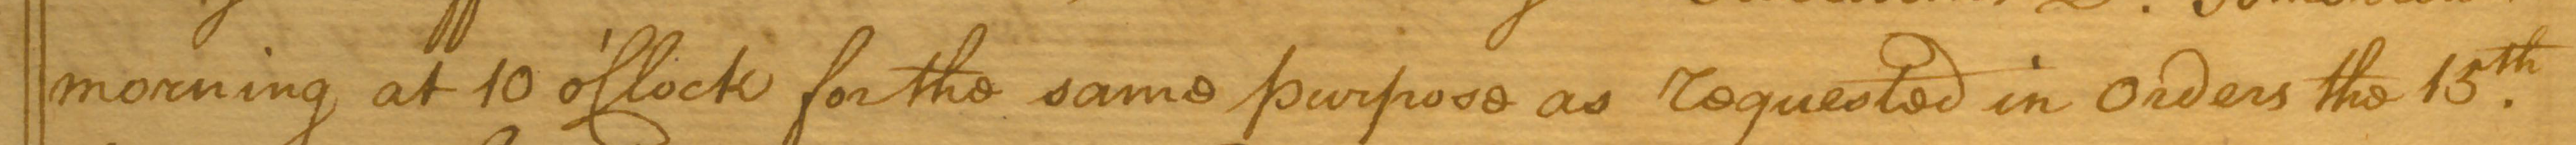morning at 10 o'Clock for the same purpose as requested in orders the 15^th.
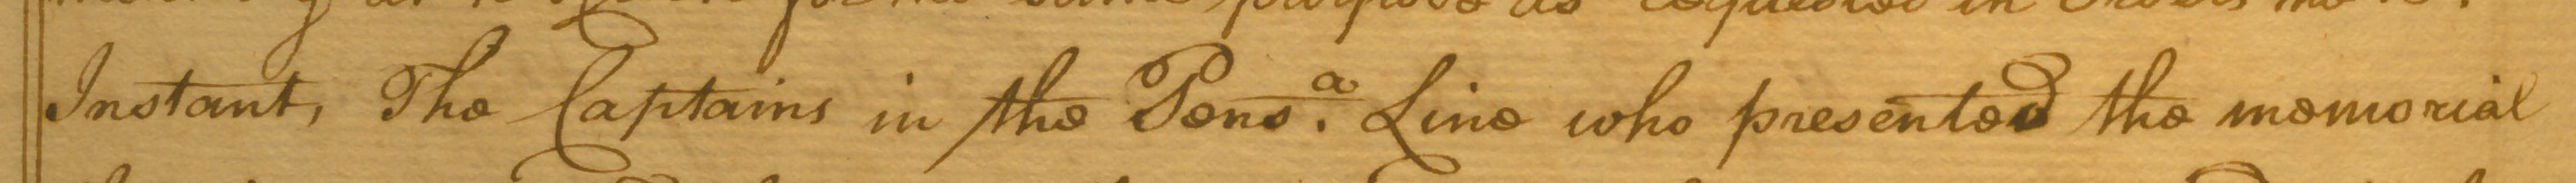Instant, The Captains in the Pens^a. Line who presented the memorial
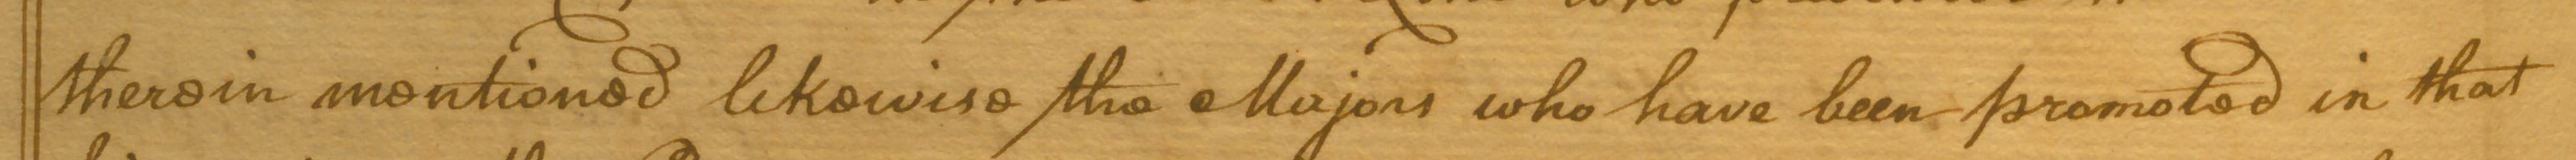therein mentioned likewise the Majors who have been promoted in that
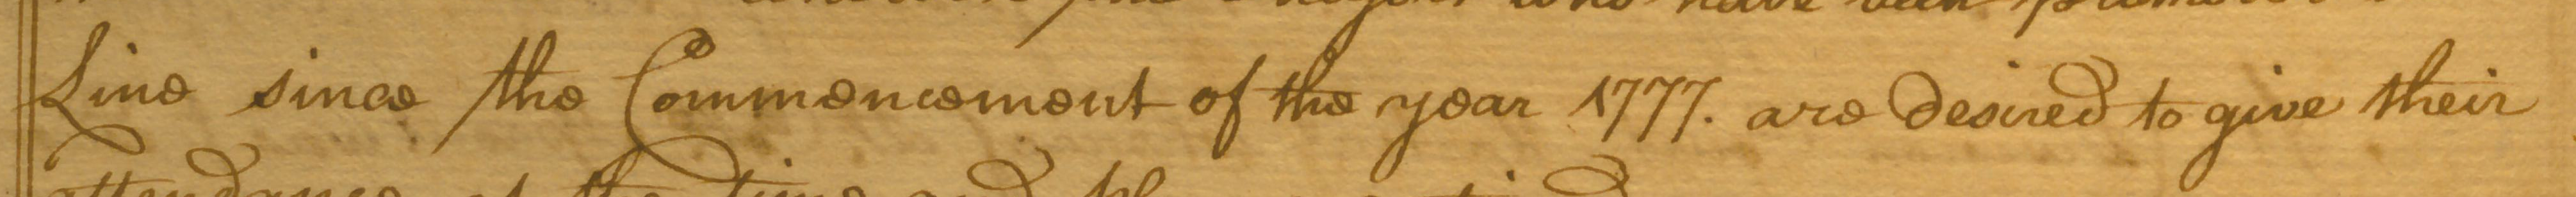Line since the Commencement of the year 1777. are desired to give their
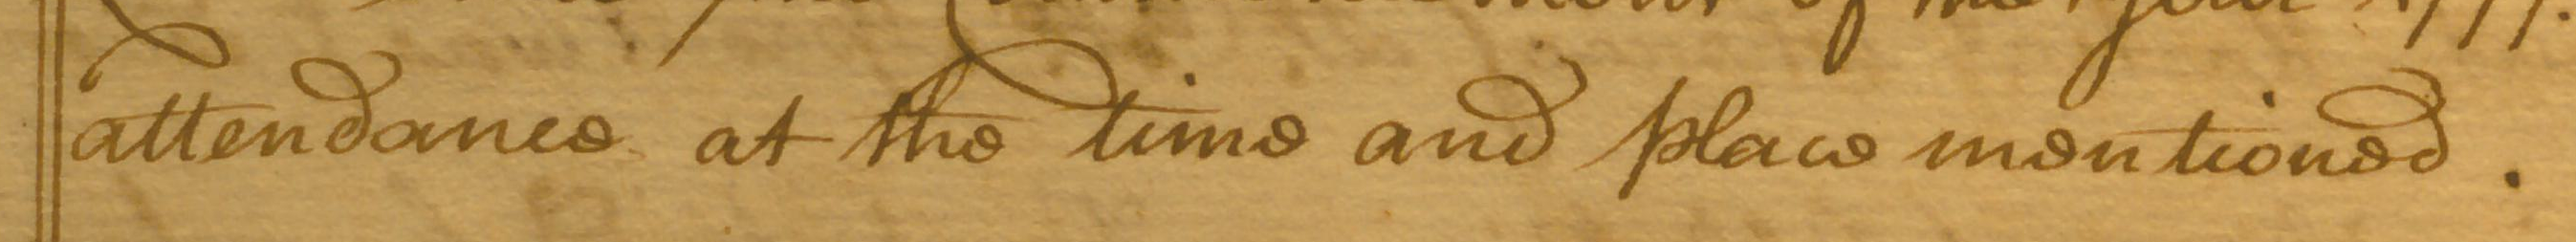attendance at the time and place mentioned.
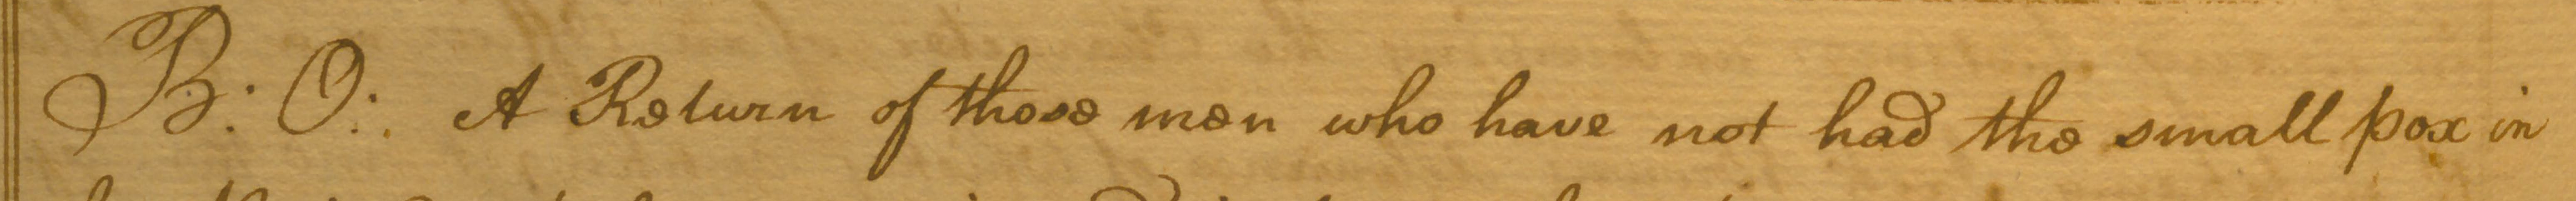B: O: A Return of those men who have not had the small pox in
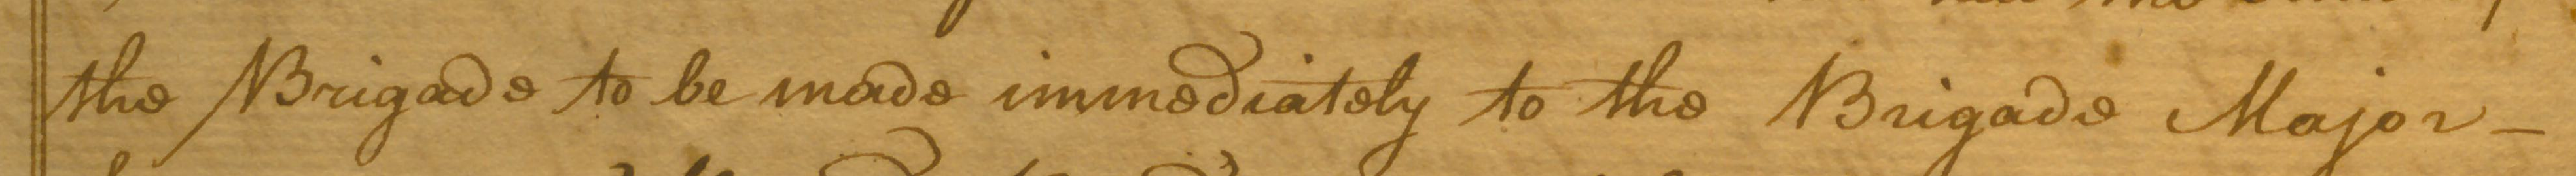the Brigade to be made immediately to the Brigade Major-
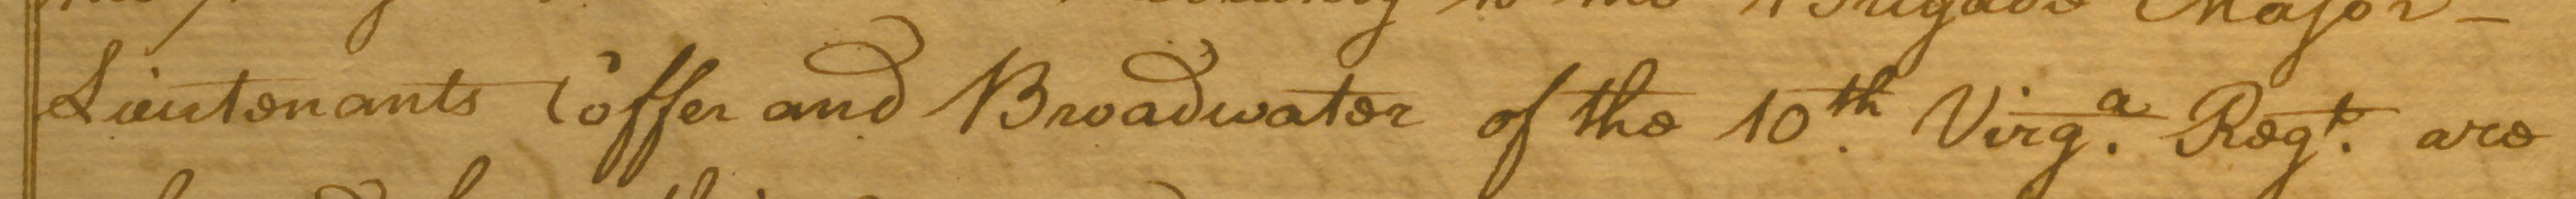Lieutenants Coffer and Broadwater of the 10^th. Virg^a. Reg^t. are
